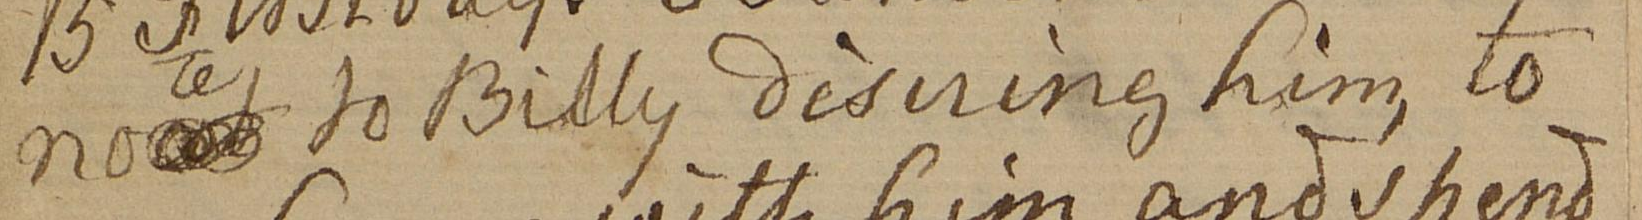no[xt] to Billy desiring him, to
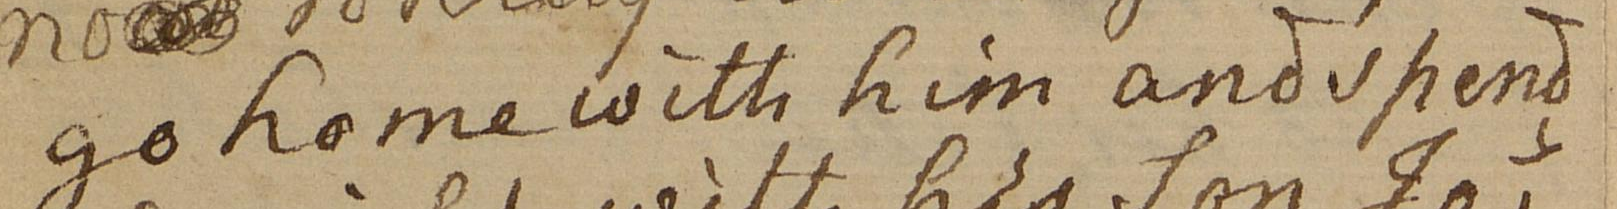go home with him and spend
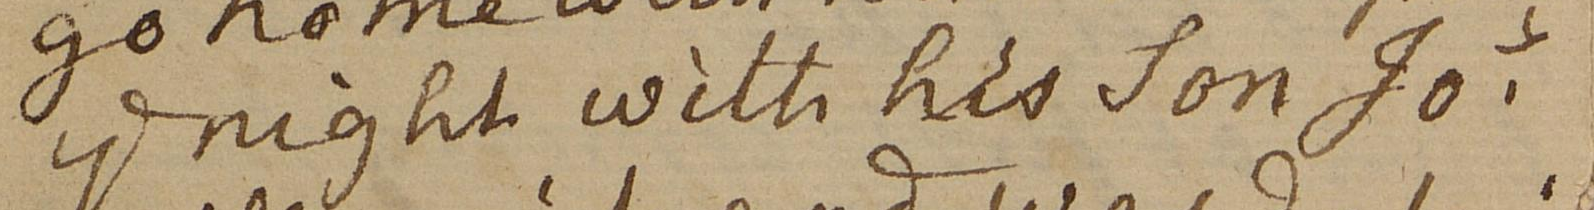y^e night with his Son Jo^y.
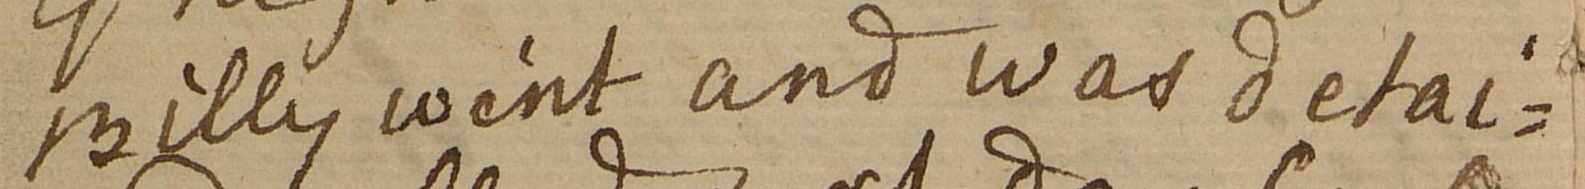Billy went and was detai-
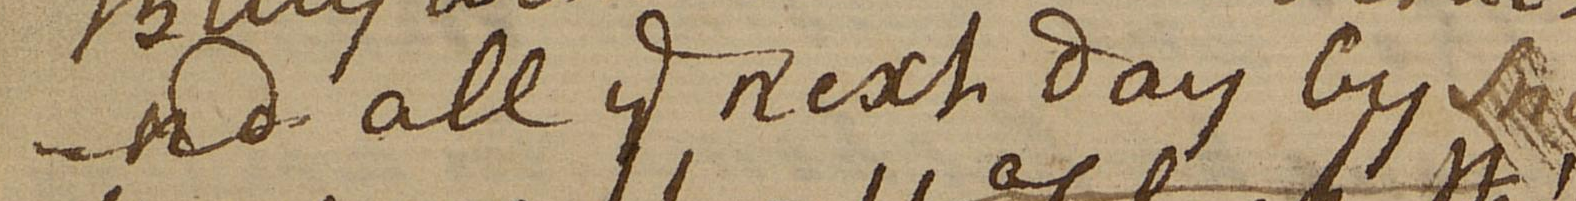-nd all y^e next day by Snow
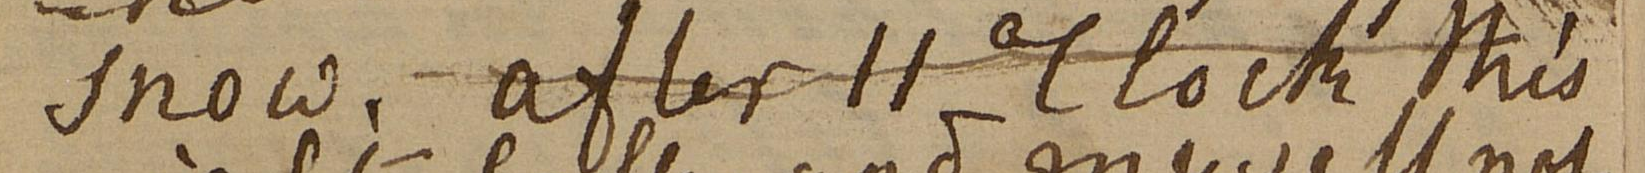Snow, after 11 ^o Clock this
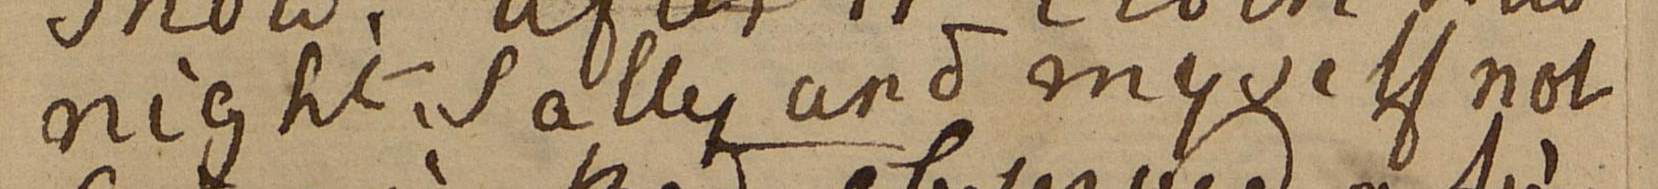night, Sally and myself not
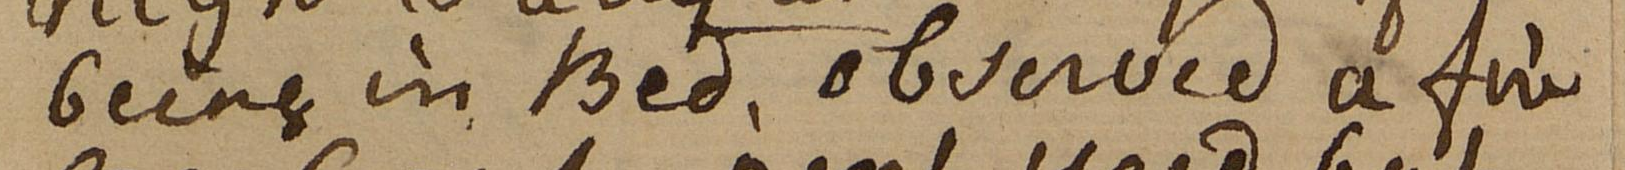being in Bed, observed a fire
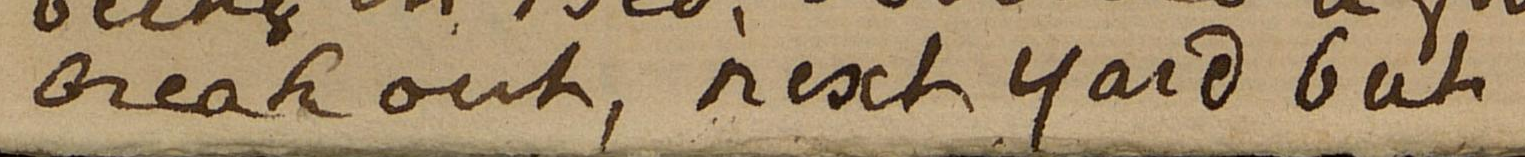break out, next yard but
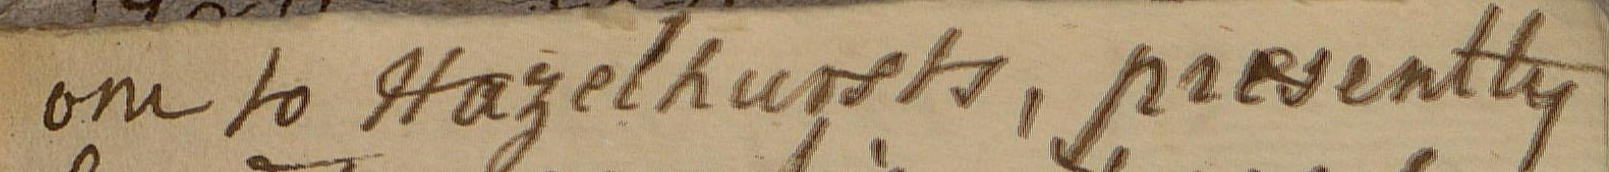one to Hazelhursts, presently
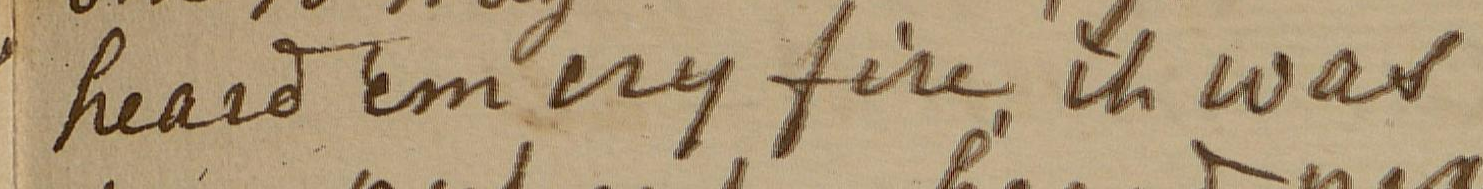heard Em cry fire, it was
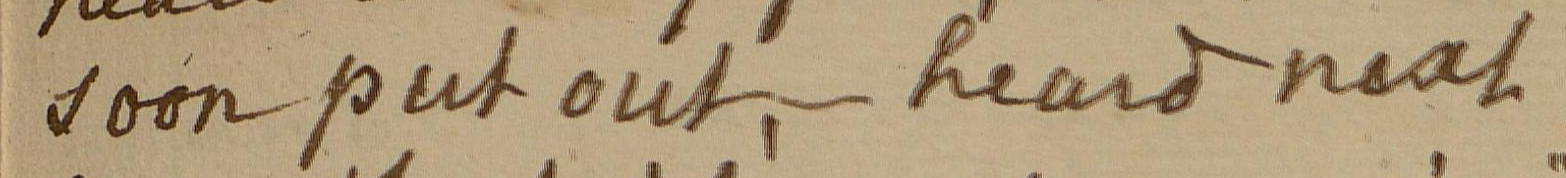soon put out,- heard next
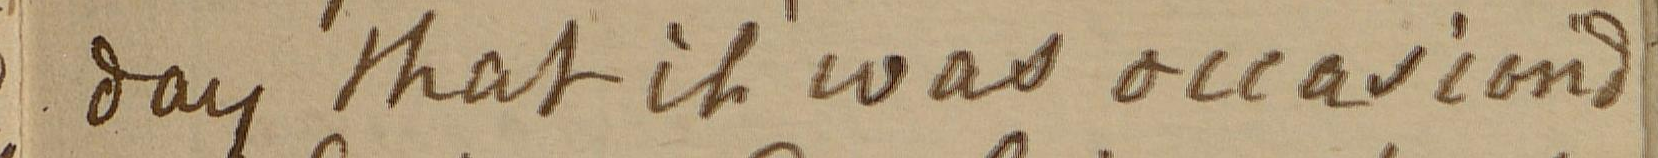day that it was occasion'd
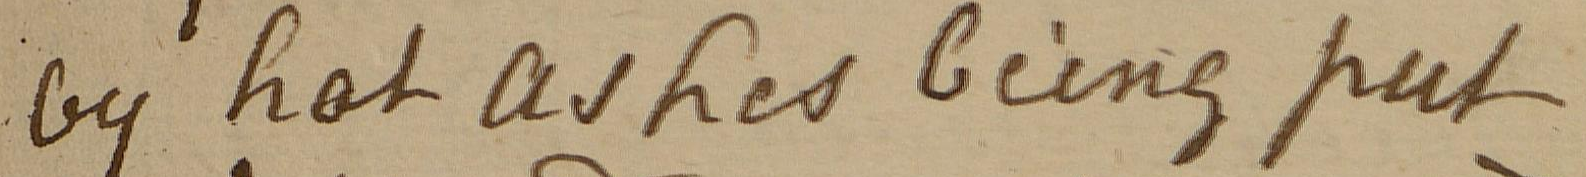by hat ashes being put
